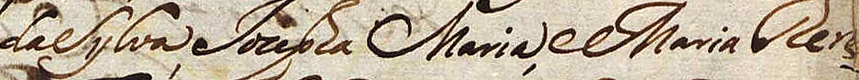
da Sylva, Jozepha Maria, e Maria Ther
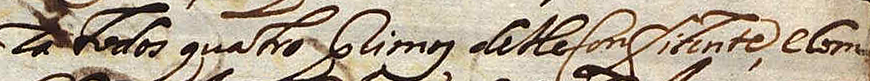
za todos quatro primos delle Confitente, e com
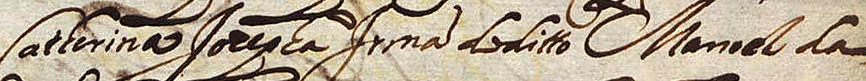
Catherina Jozepha Jrmã do ditto Manoel da
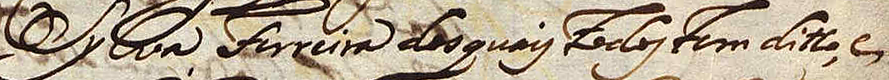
Sylva Ferreira dos quais todos tem ditto, e
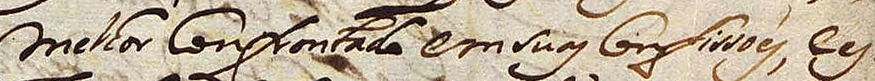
melhor Confrontado em suas Confissões, e es
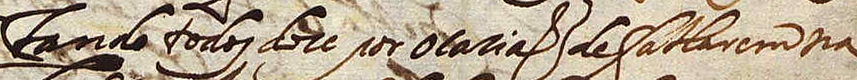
tando todos doze por ocaziaõ de fallarem na
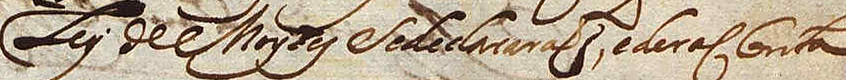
Ley de Moyzes Se declararaõ, e deraõ Conta
